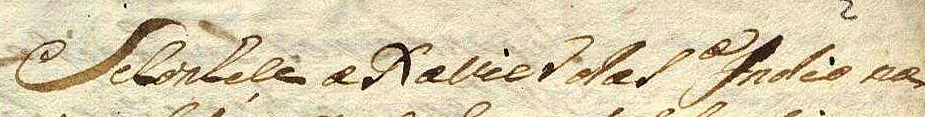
Se Conhece a Xauier da s.a Jndio na
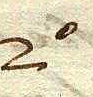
2o
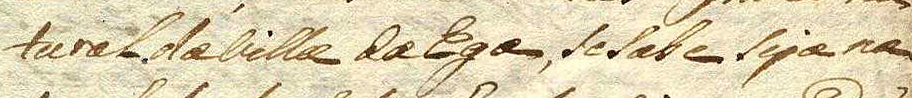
tural da villa da Ega, se sabe seja na
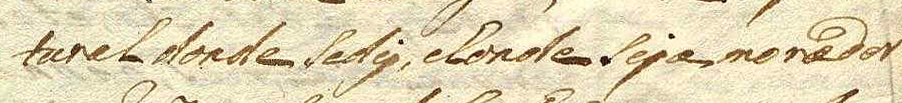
tural donde se dis, e honde seja morador
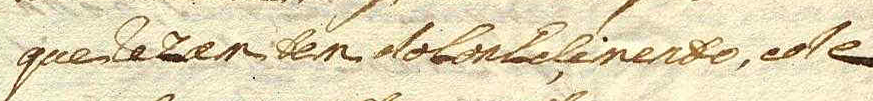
que Rezam tem do ConheCimento, e de
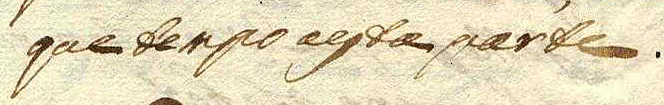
que tempo a esta parte.
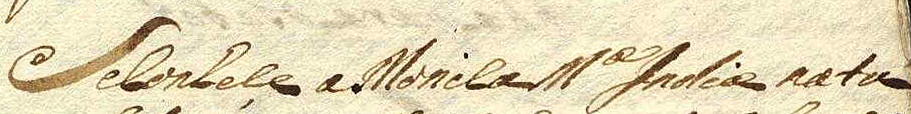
Se Conhece a MoniCa M.a Jndia natu
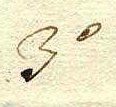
3o
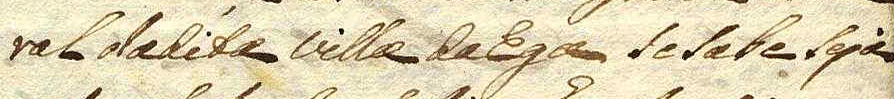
ral da dita villa da Ega se sabe seja
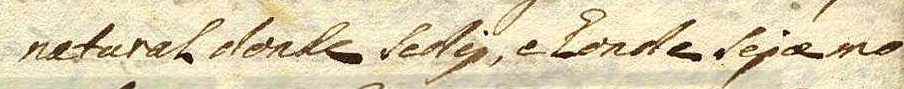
natural donde se dis, e honde seja mo
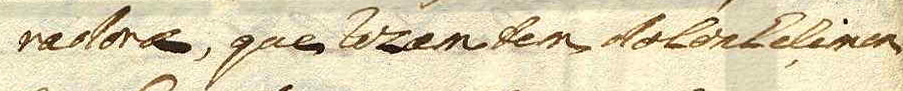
radora, que Rezam tem do ConheCimen
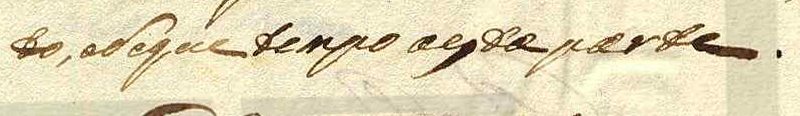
to, e de que tempo a esta parte.
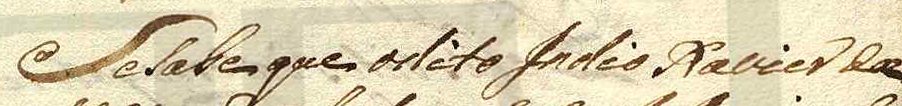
Se sabe que o dito Jndio Xavier da
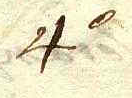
4o
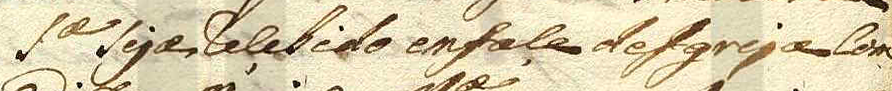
s.a seja Recebido em face de Jgreja Com
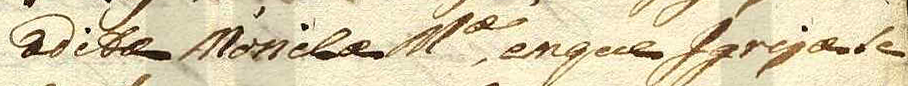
a dita MoniCa M.a, em que Jgreja se
